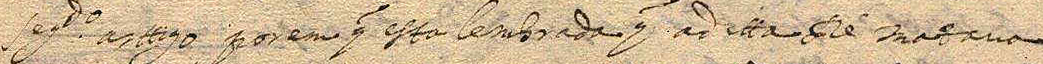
segdo. arttigo, porem q̄ esta lembrada q̄ a ditta Ré mataua
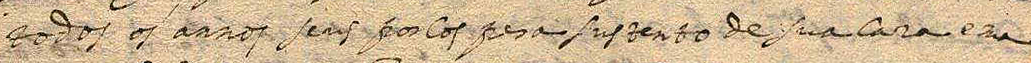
todos os annos seus porcos pera sustento de sua caza e ma
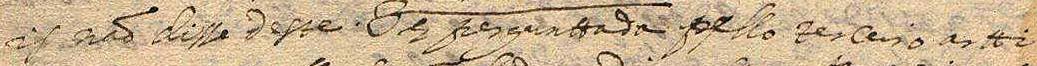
is não disse deste. item E pergunttada pello terceiro artti
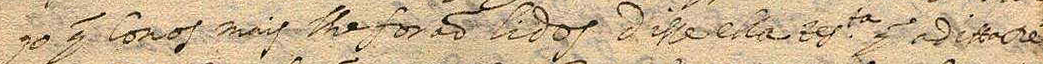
go q̄ Con os mais lhe forão lidos disse ella tes.ta q̄ a ditta Ré
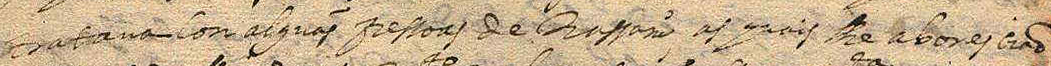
trataua con alguas̄ pessoas de Nassam, as quais lhe aborescião
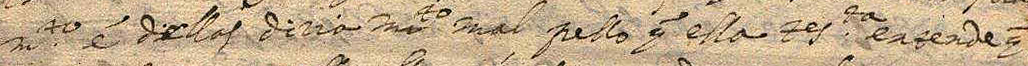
mto. e dellas dizia mto mal, pello q̄ ella tes.ta entende q̄
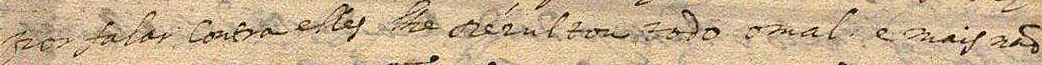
por falar contra elles lhe Rezultou todo o mal e mais não
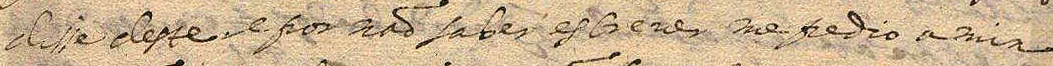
disse deste, e por não saber escreuer me pedio a min
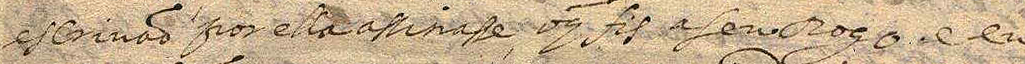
escriuão por ella assinasse, o q̄ fis a seu Rogo. e eu
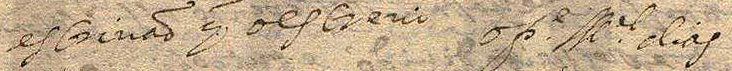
escriuão q̄ o escreui. o p.e M.el dias
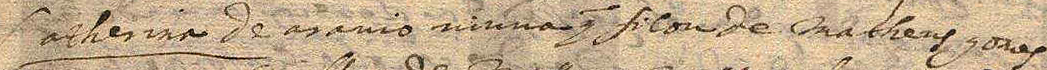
Catherina de arauio uiuua q̄ ficou de Matheus gomes
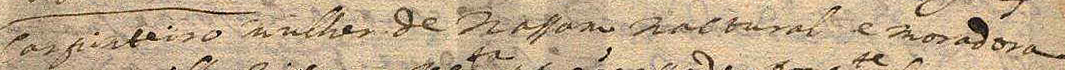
carpinteiro mulher de Nassam, natural e moradora
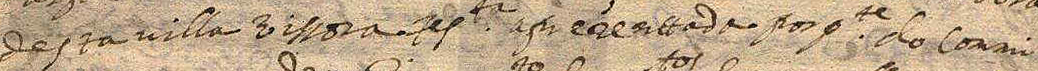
desta uilla Vissoza testa. aprezenttada por p.te do commi
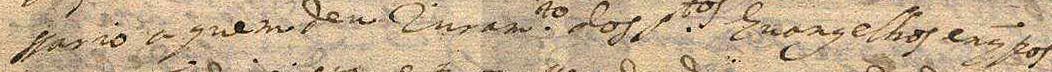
ssario a quem deu Iuram.to dos S.tos Euangelhos en q̄ pos
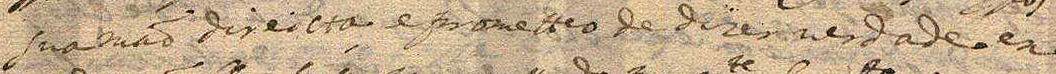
sua mão direicta, e prometteo de dizer uerdade en
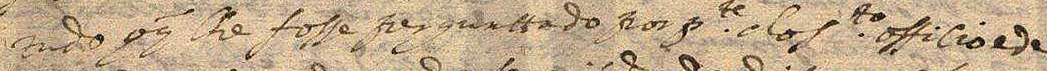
tudo o q̄ lhe fosse pergunttado por pte. do Sto. offiÇio e de
